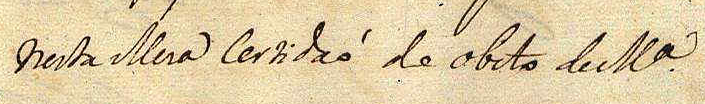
nesta Meza Certidaõ de obito de M.a
